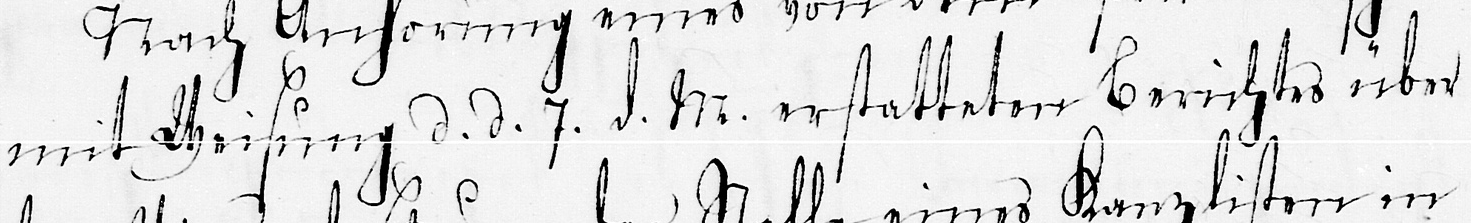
mit Weisung d. d. 7. d. M. erstatteten Berichtes über
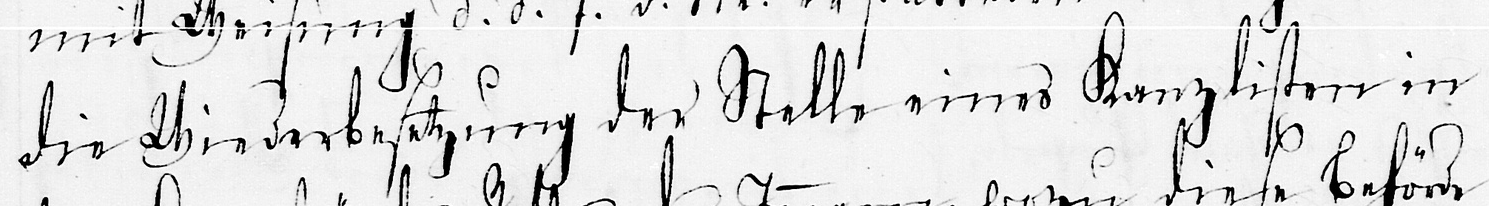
die Wiederbesetzung der Stelle eines Kanzlisten in
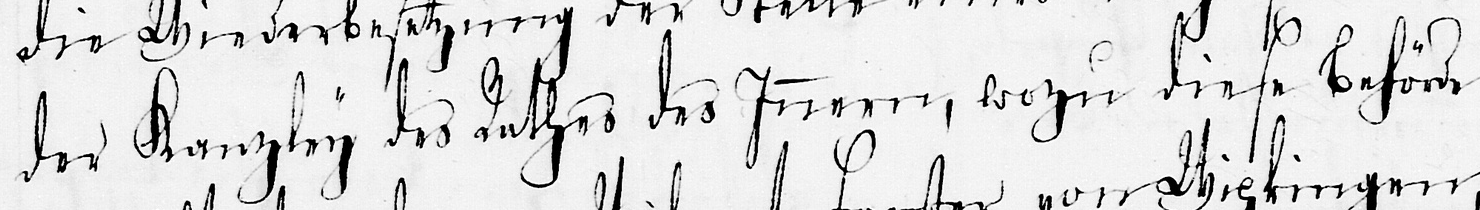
der Kanzley des Rathes des Innern, wozu diese Behörde
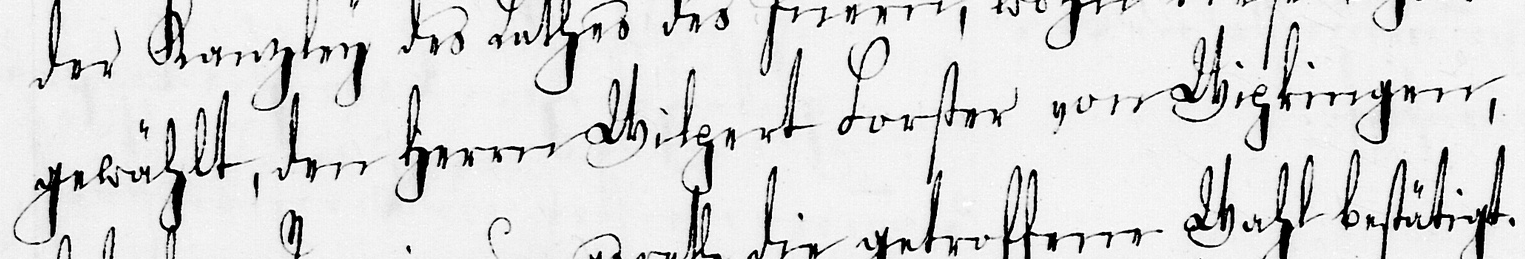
gewählt, den Herrn Wilpert Forster von Wipkingen,
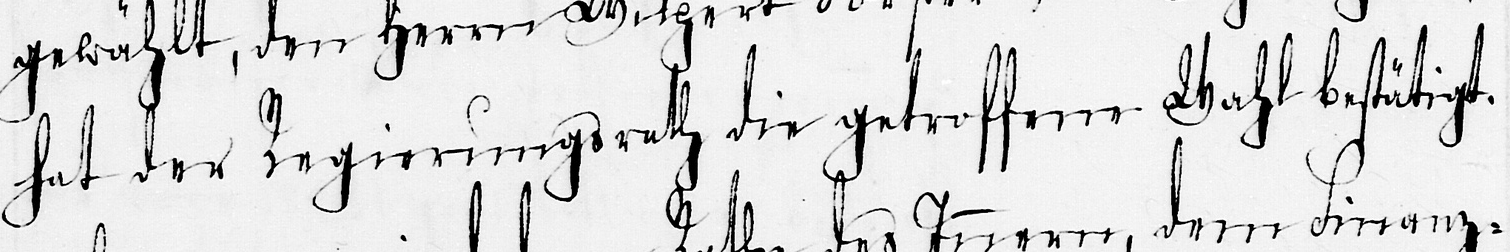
hat der Regierungsrath die getroffene Wahl bestätigt.
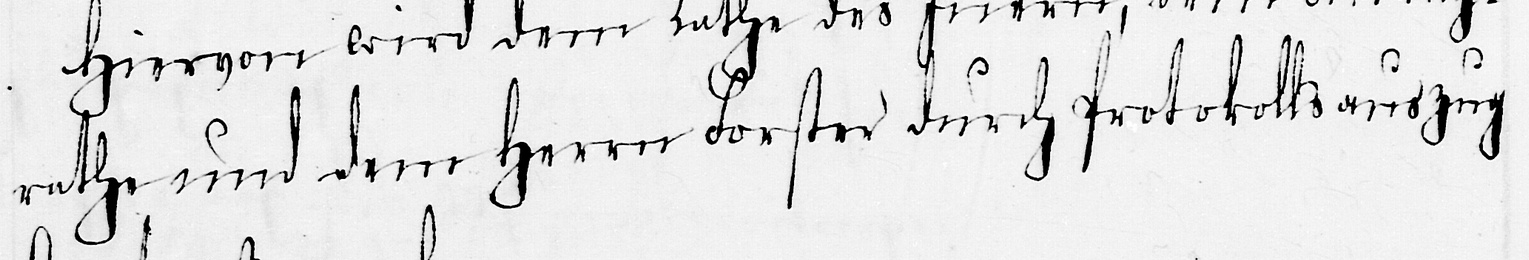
rathe und dem Herrn Forster durch Protokollsauszug
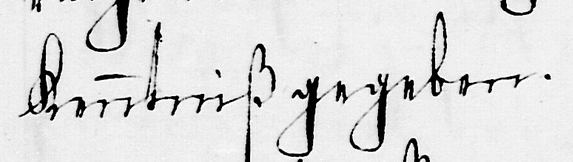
Kenntniß gegeben.
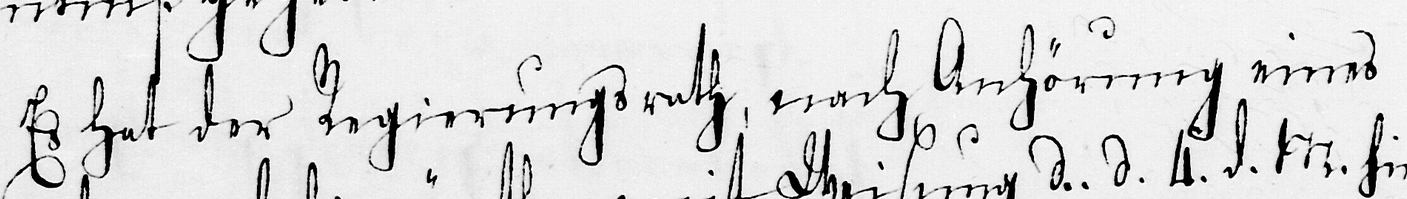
Es hat der Regierungsrath, nach Anhörung eines
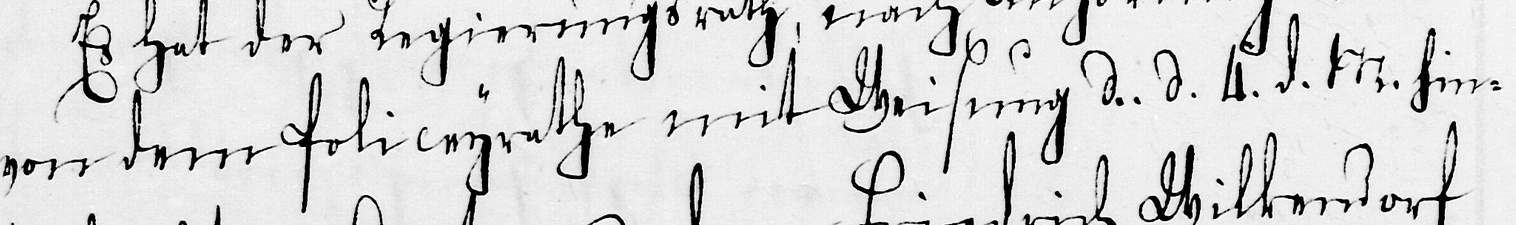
von dem Policeyrathe mit Weisung d. d. 4. d. M. hin¬
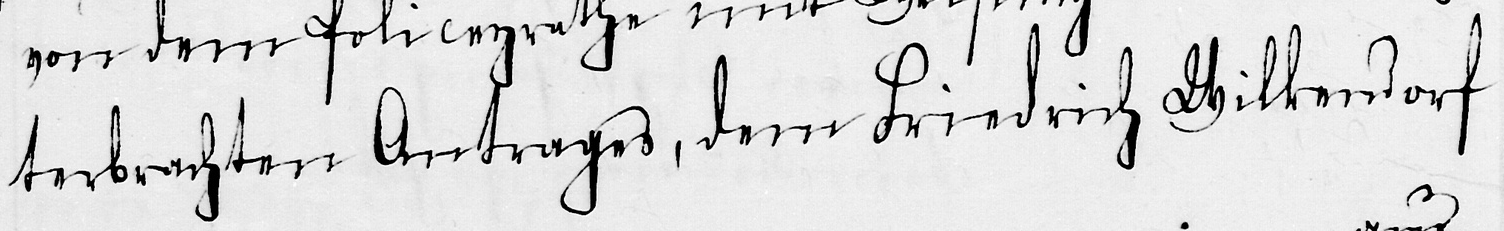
terbrachten Antrages, dem Friedrich Wilkendorf
